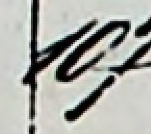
107
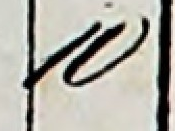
10
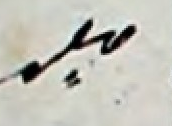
do
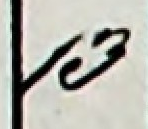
13
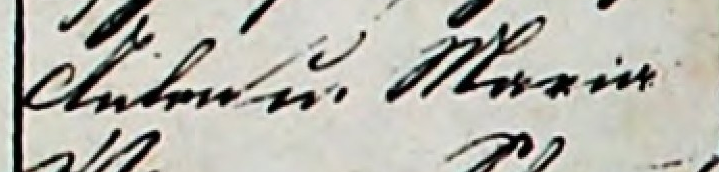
Anton u. Maria
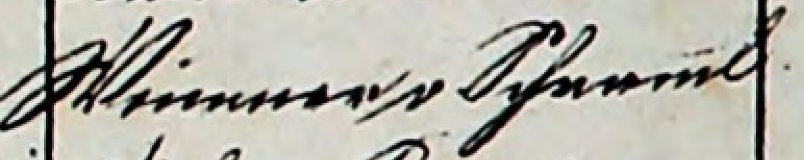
Wimmer v Scharmml
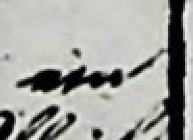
ein
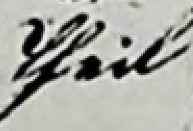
Theil
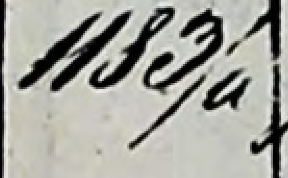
1183/a
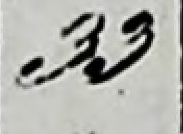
33
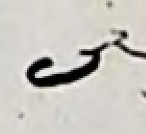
5
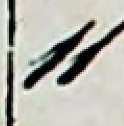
11
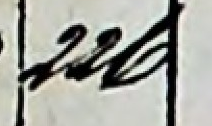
226
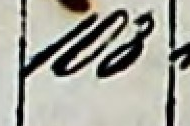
108
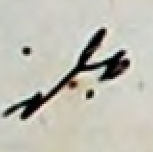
do
